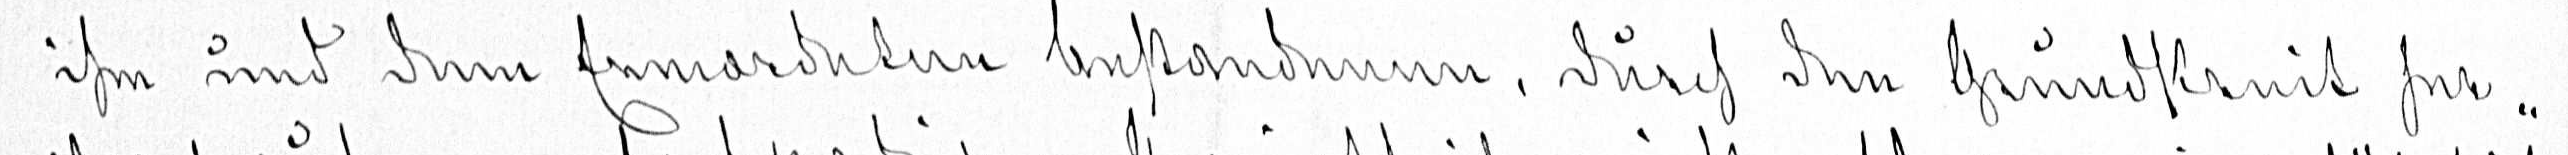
ihm und dem Ermordeten bestandenen, durch den Grundstreit her¬
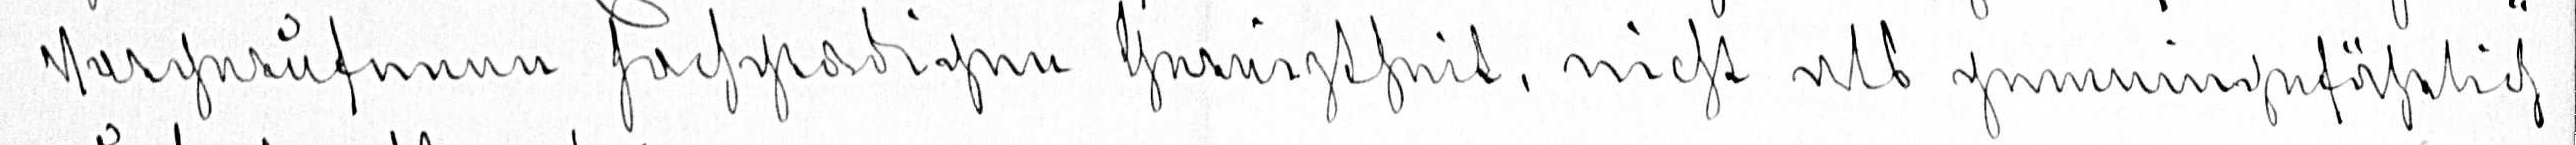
vorgerufenen hochgradigen Gereiztheit, nicht als gemeingefährlich
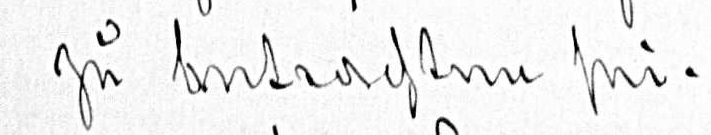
zu betrachten sei.
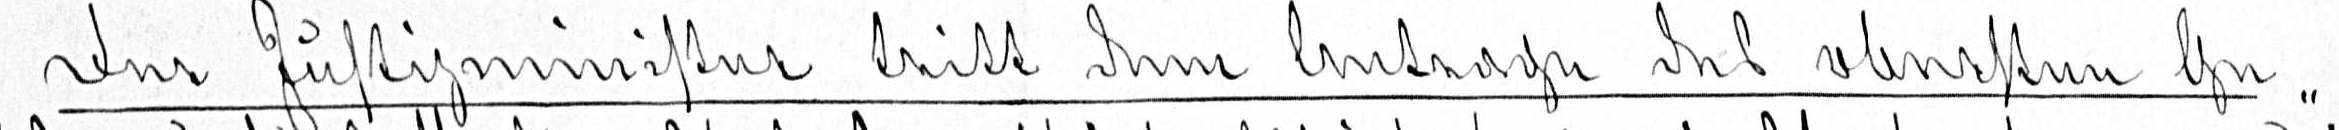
Der Justizminister tritt dem Antrage des obersten Ge¬
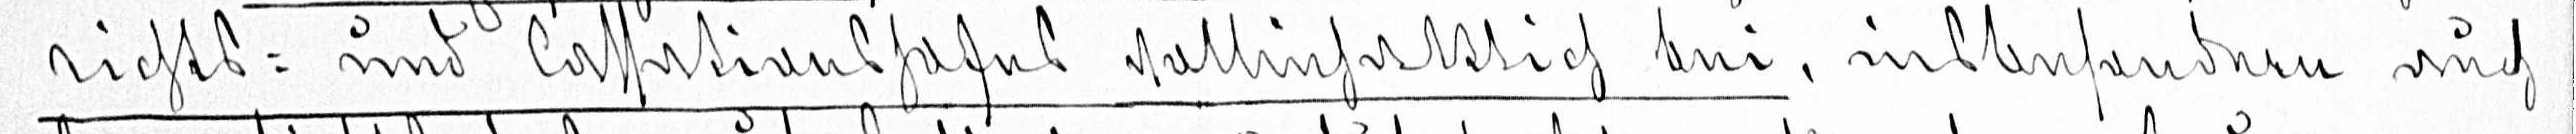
richts- und Cassationshofes vollinhaltlich bei, insbesondere auch
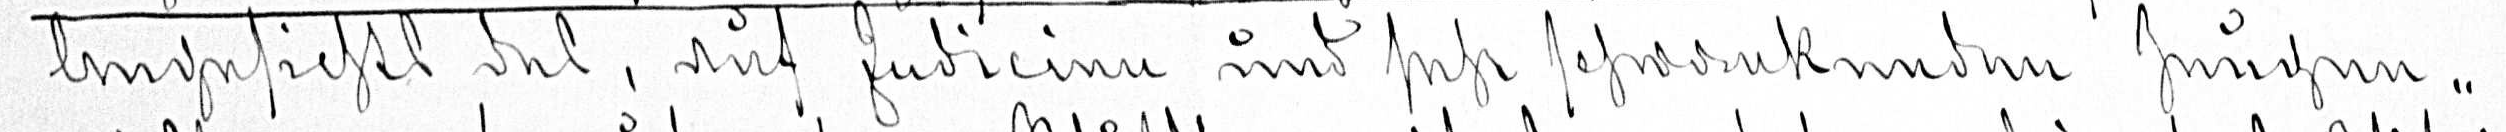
Angesichts des, auf Indicien und sehr schwankenden Zeugen¬
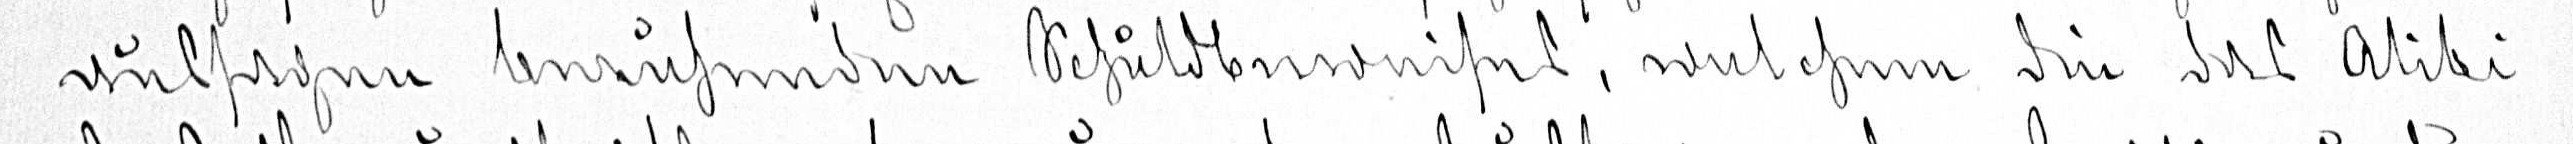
aussagen beruhenden Schuldbeweises, welchem die das Alibi
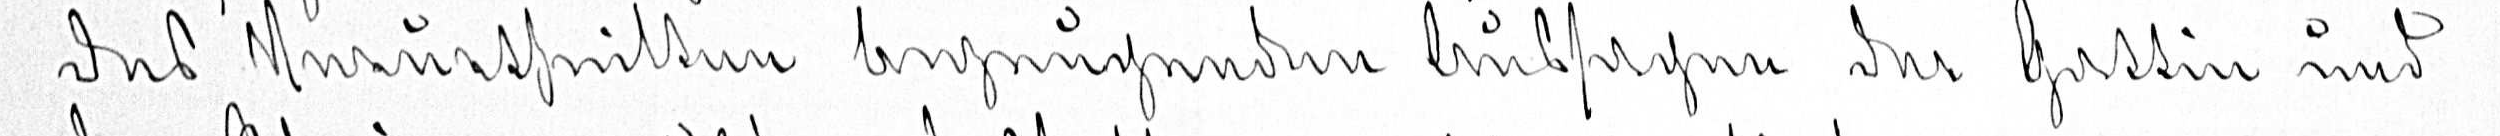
des Verurtheilten bezeugenden Aussagen der Gattin und
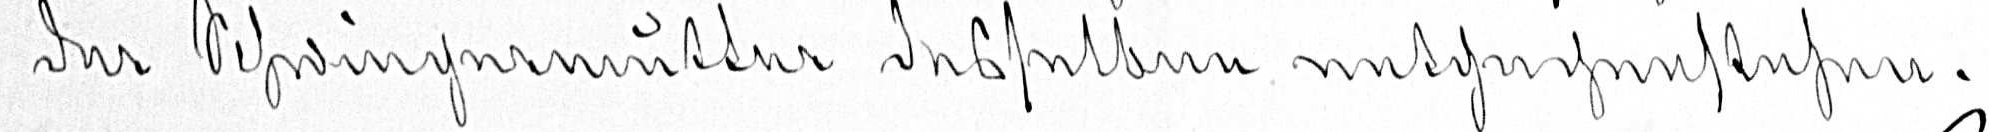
der Schwiegermutter desselben entgegenstehen.
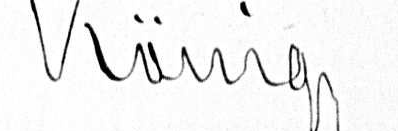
König
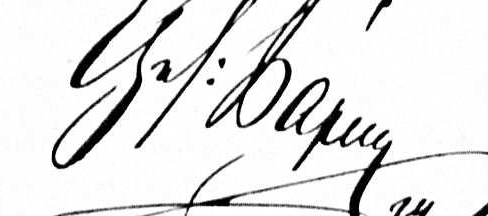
Ges: Bá?ny?
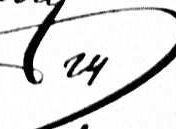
24
